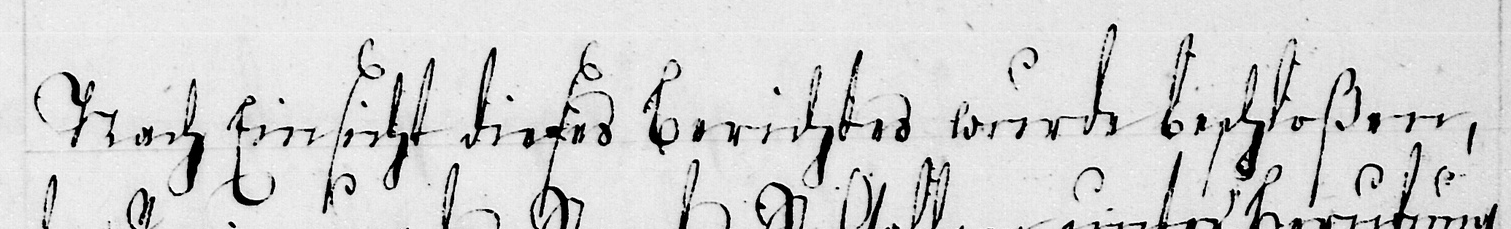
Nach Einsicht dieses Berichtes wurde beschloßen,
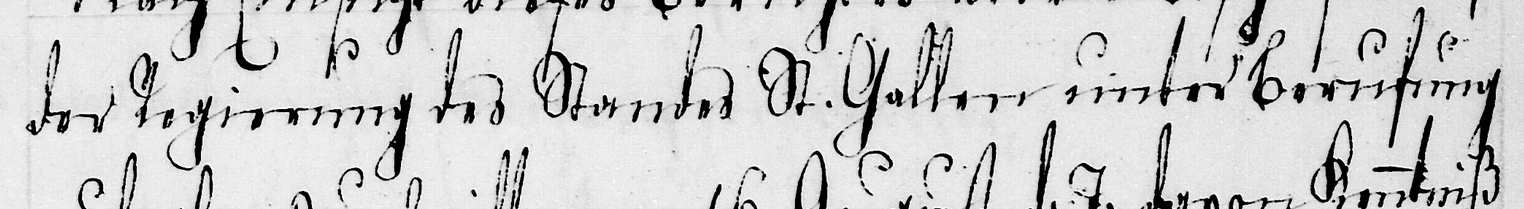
der Regierung des Standes St. Gallen unter Berufung
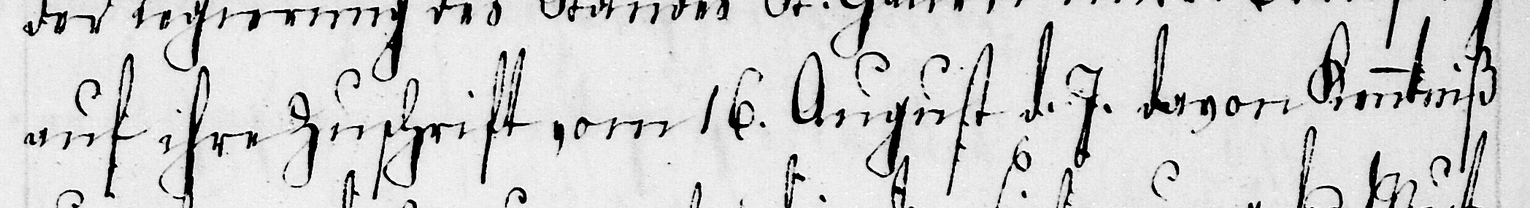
auf ihre Zuschrift vom 16. August d. J. davon Kenntniß
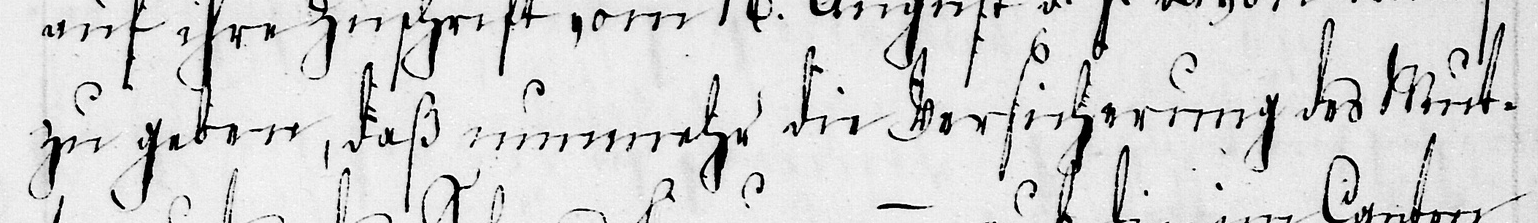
zu geben, daß nunmehr die Versicherung des Mut¬
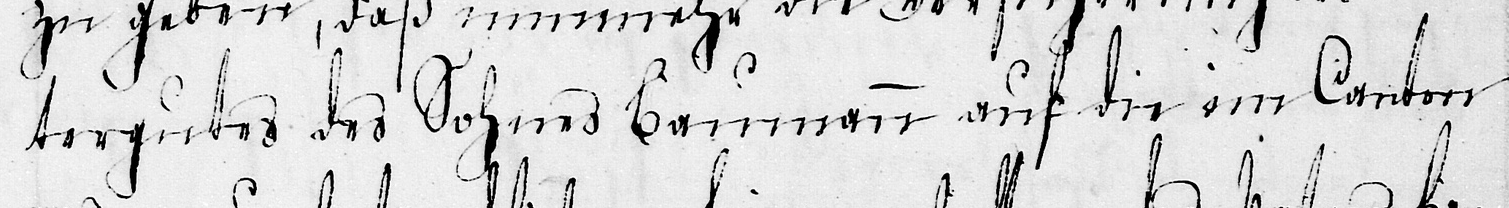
tergutes des Sohnes Baumann auf die im Canton
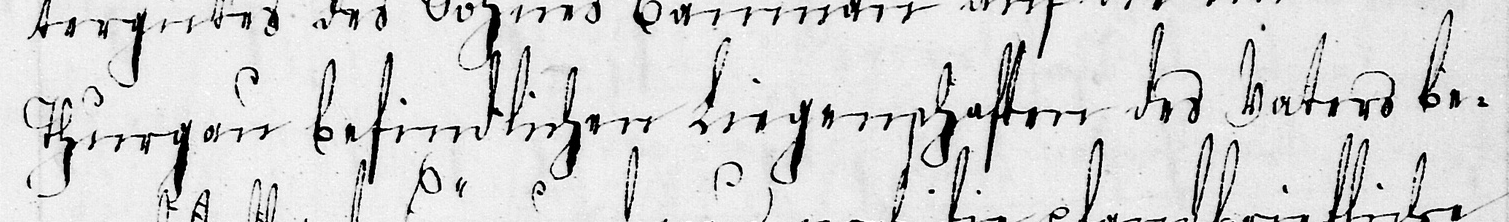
Thurgau befindlichen Liegenschaften des Vaters be¬
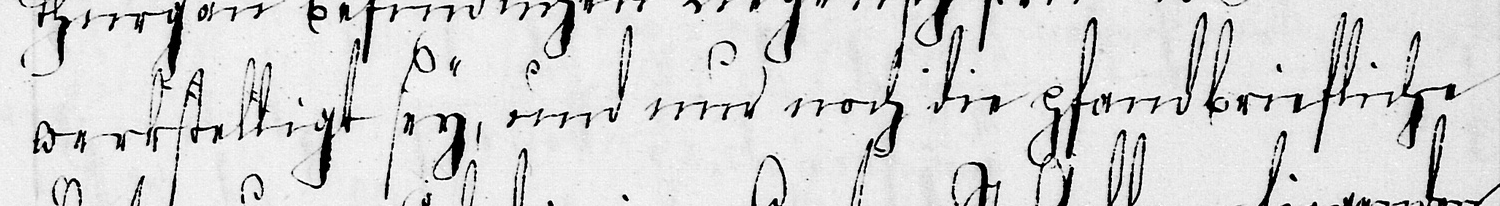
werkstelligt sey, und nur noch die pfandbriefliche
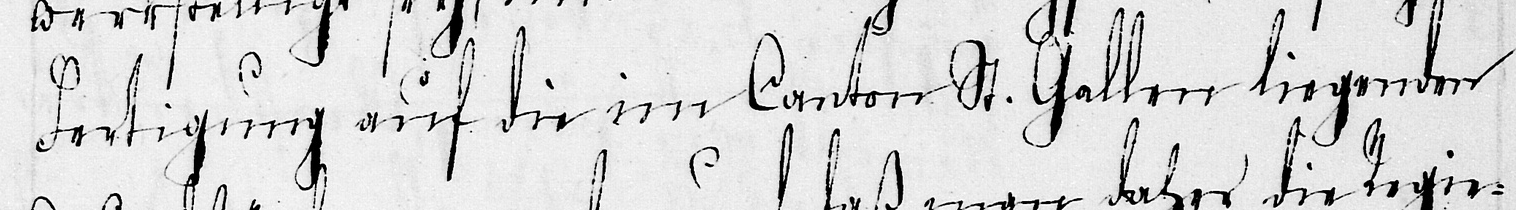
Fertigung auf die im Canton St. Gallen liegenden
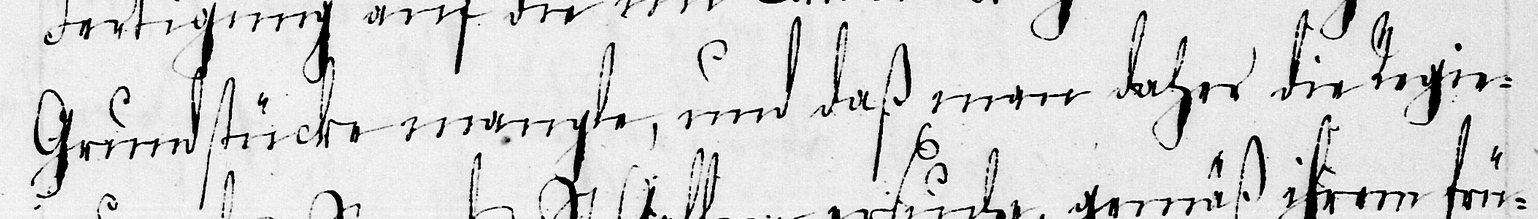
Grundstücke mangle, und daß man daher die Regie¬
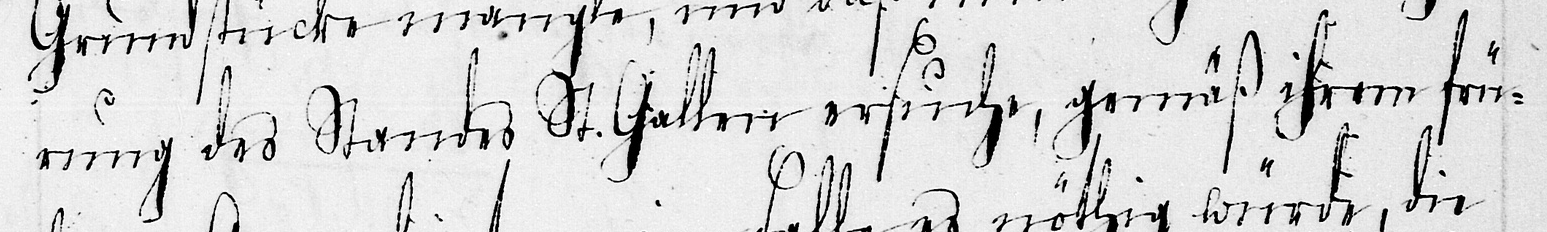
rung des Standes St. Gallen ersuche, gemäß ihrem frü¬
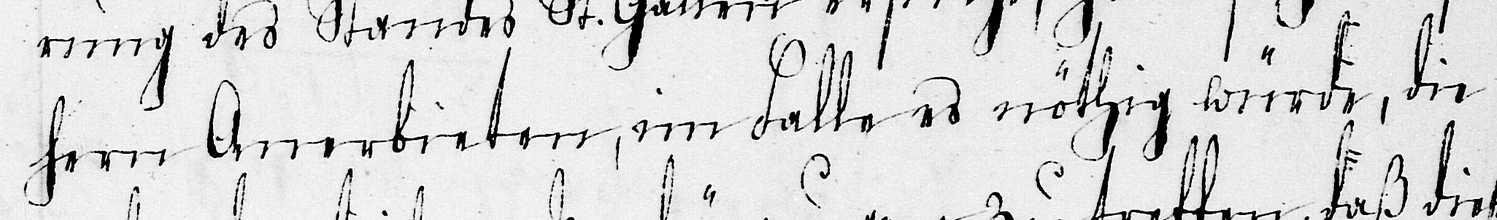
hern Anerbieten, im Falle es nöthig würde, die
